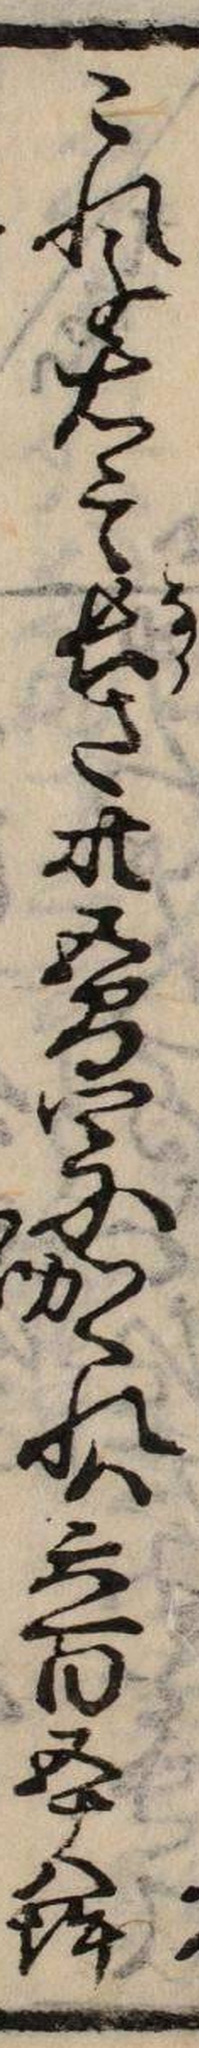これを右之長さ卅五間四にかくれは六百五十八坪
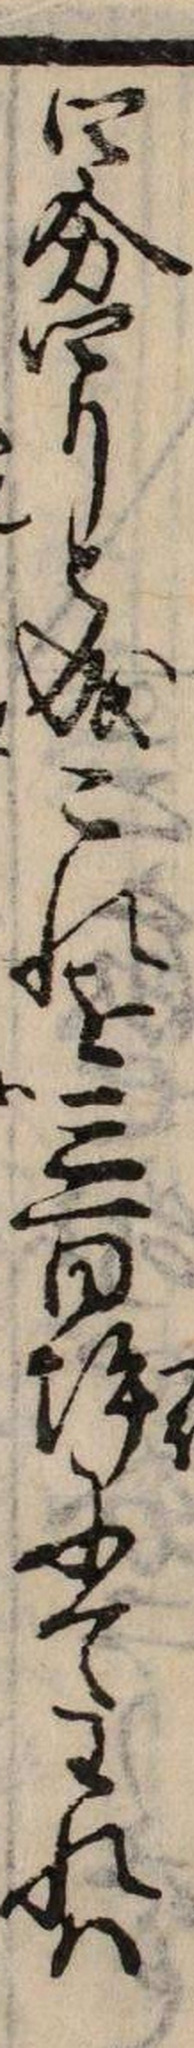四分四りと成これを三百坪にてわれは
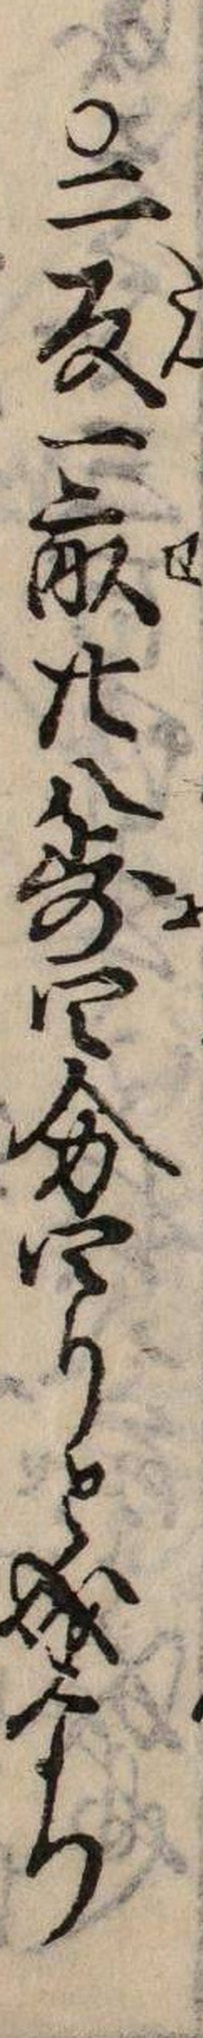○二反一畝廿八歩四分四りと成なり
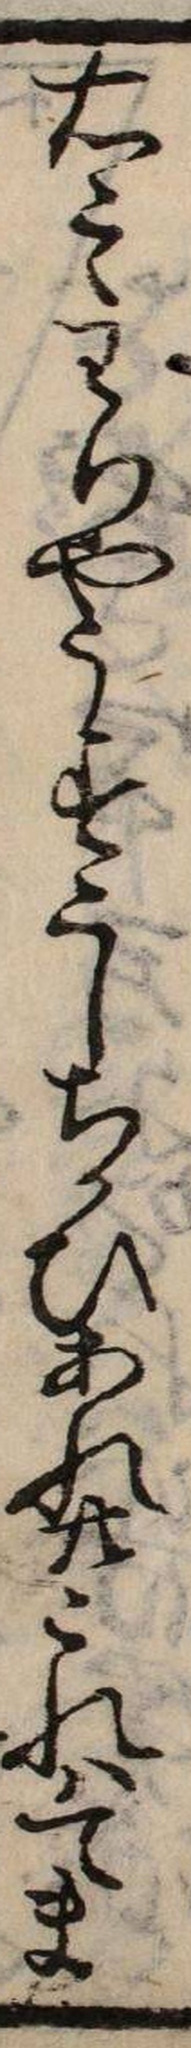右之わりやうすこしちかひあれ共これはてま
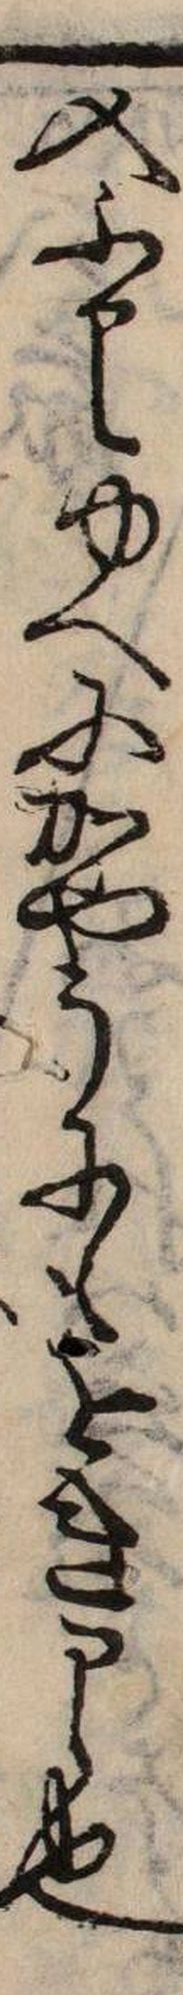入不申候ゆへにかやうにもをき申候也
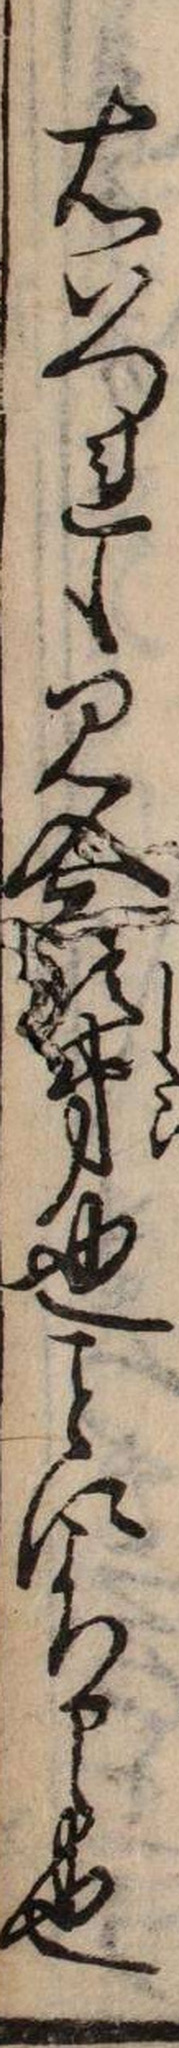右いつれも見合次第也ことにより申候也

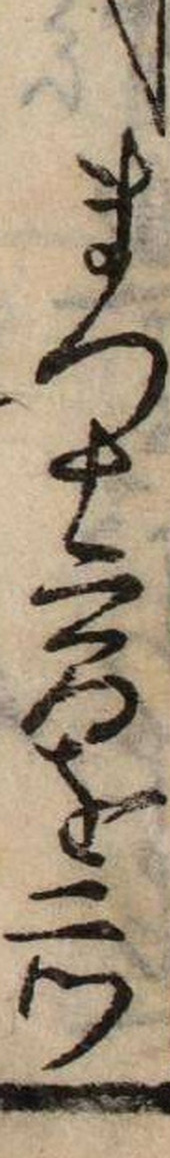まつ十二間を二つ
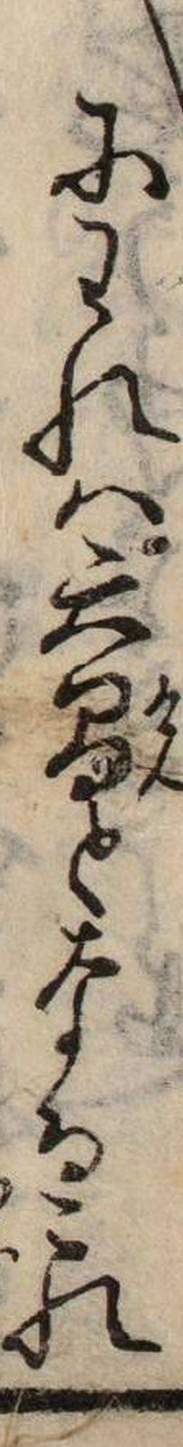にわれは六間となるこれ
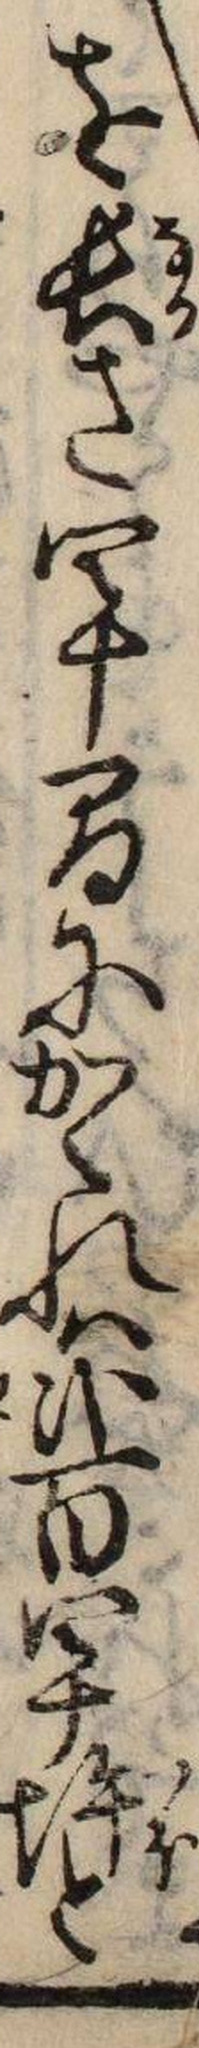を長さ四十間にかくれは弍百四十坪と
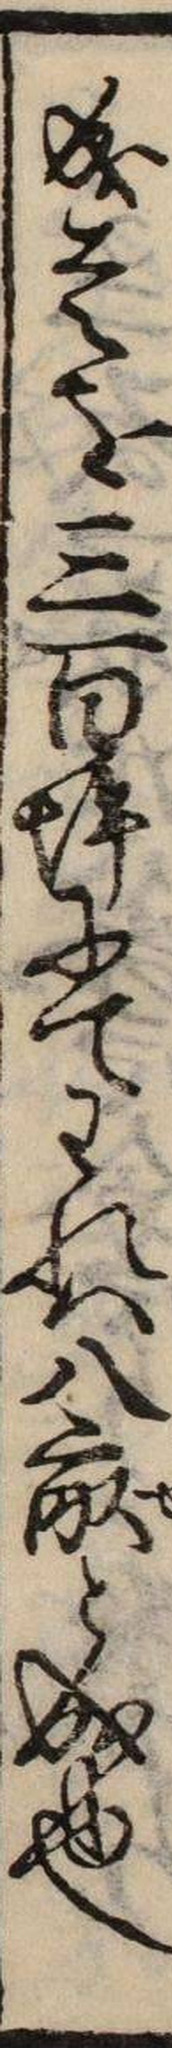成是を三十坪にてわれは八畝と成也
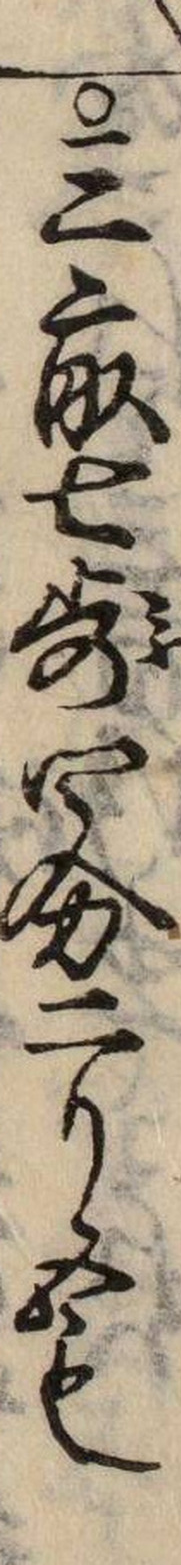⚪︎三畝七歩四分二り五毛
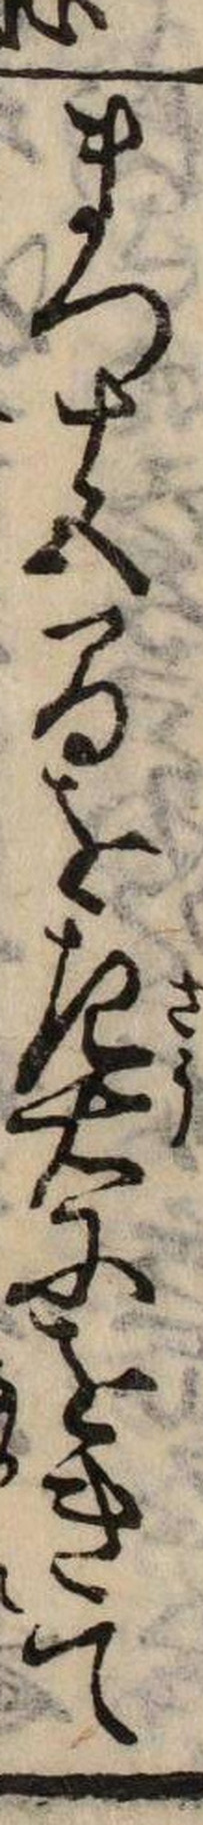まつ十五間を左右にをきて
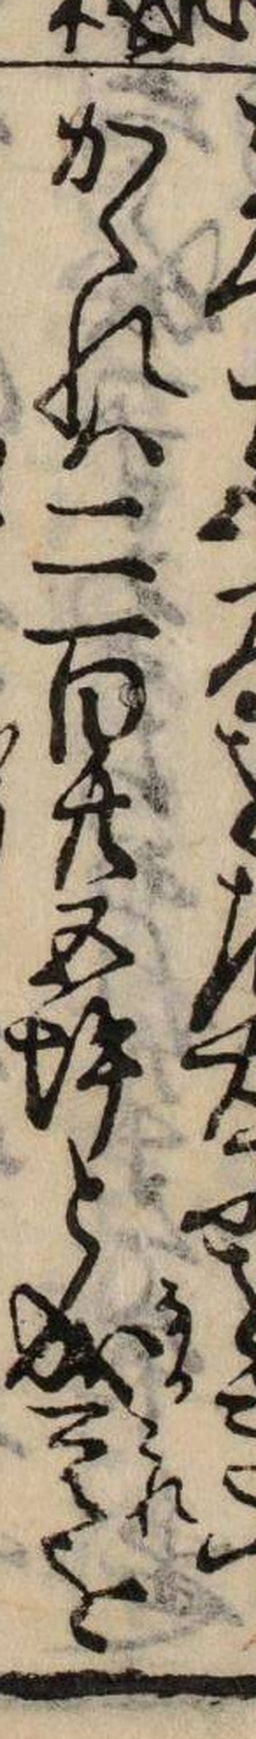かくれは二百廿五坪と成是を
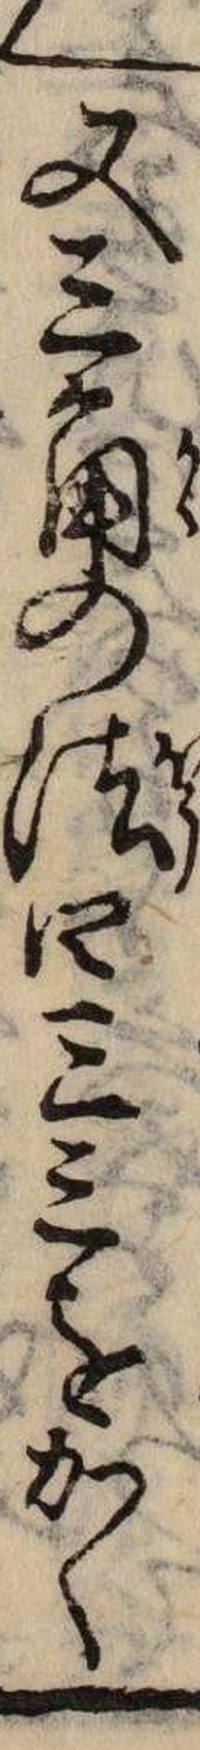又三角の法四三三をかく
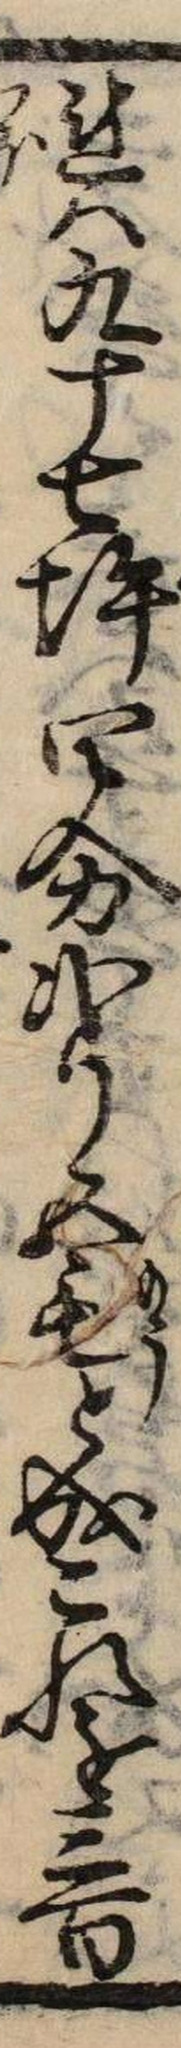れは九十七坪四分弍り五毛と成これを三百＃
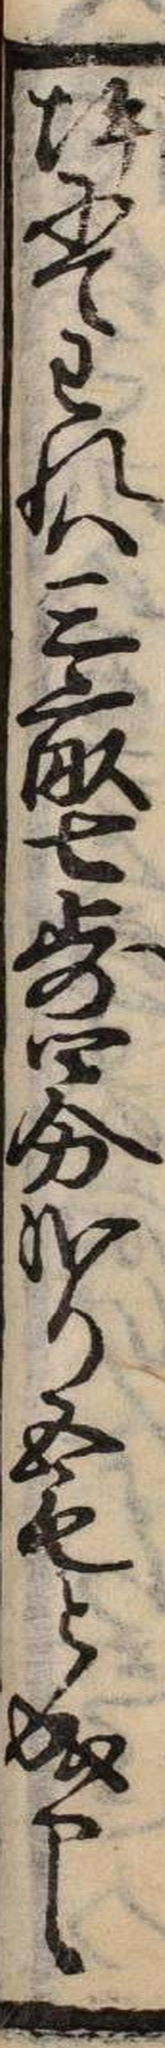坪にてわれは三畝七歩四分弍り五毛と成申候
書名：塵劫記（寛永11年自跋、京都府立京都学・歴彩館追貴8）
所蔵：京都府立京都学・歴彩館 国文学研究資料館
